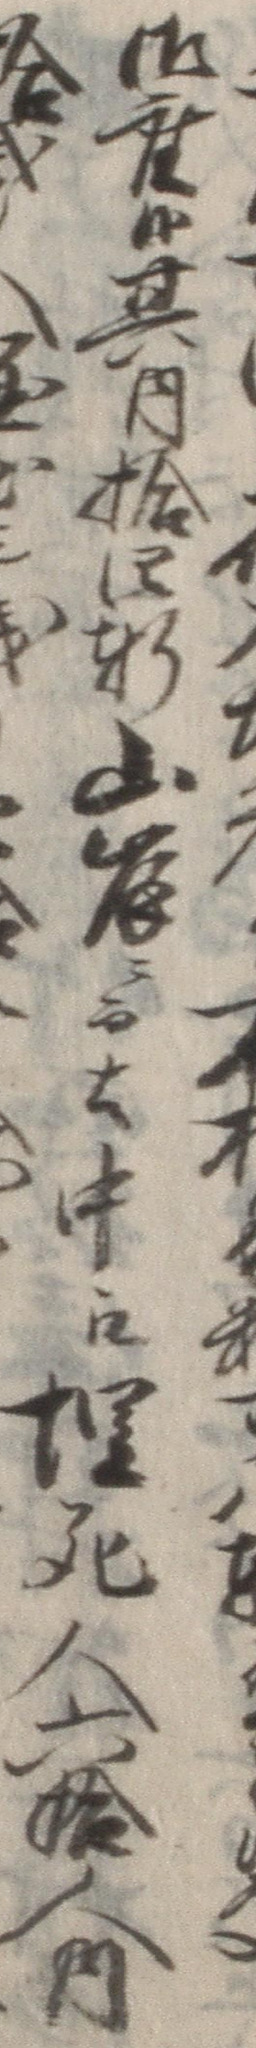御座候其内拾四軒山崩ニ而土中江埋死人六拾人内
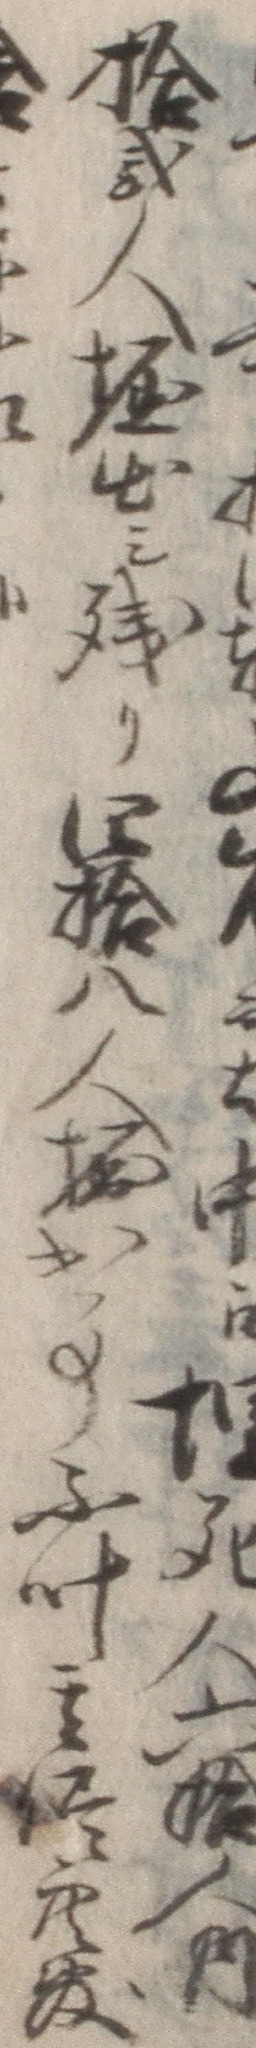拾弐人掘出シ残り四拾八人堀出事不叶其儘空敷
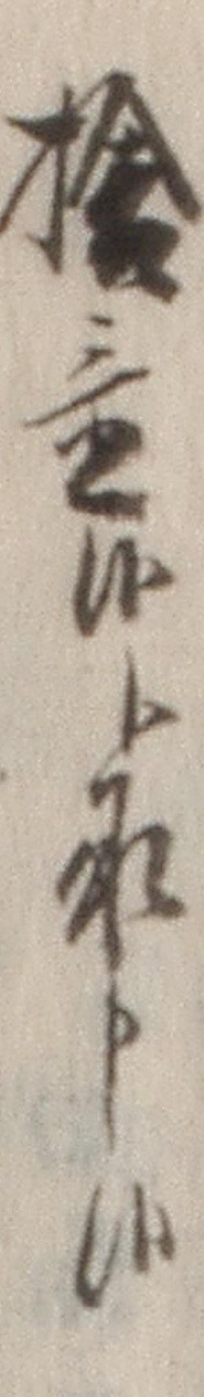捨置候ト承申候
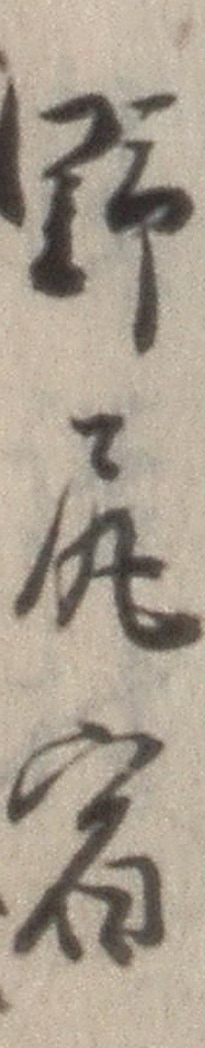野尻宿
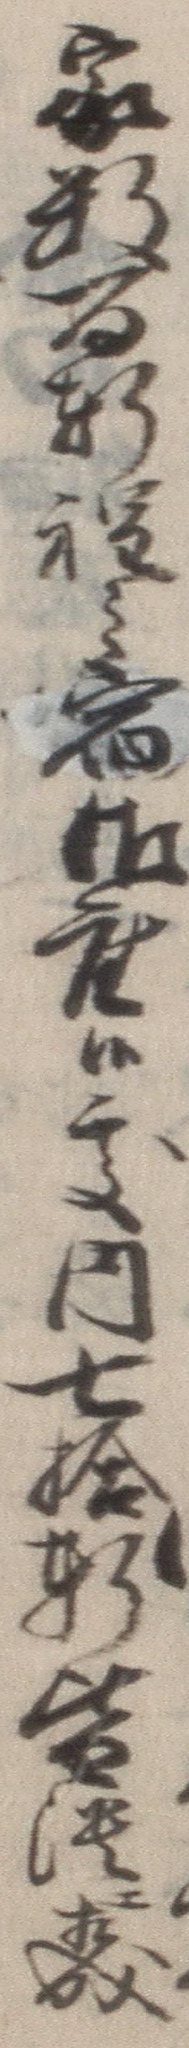家数百軒程之宿御座候處内七拾軒皆潰ニ相成
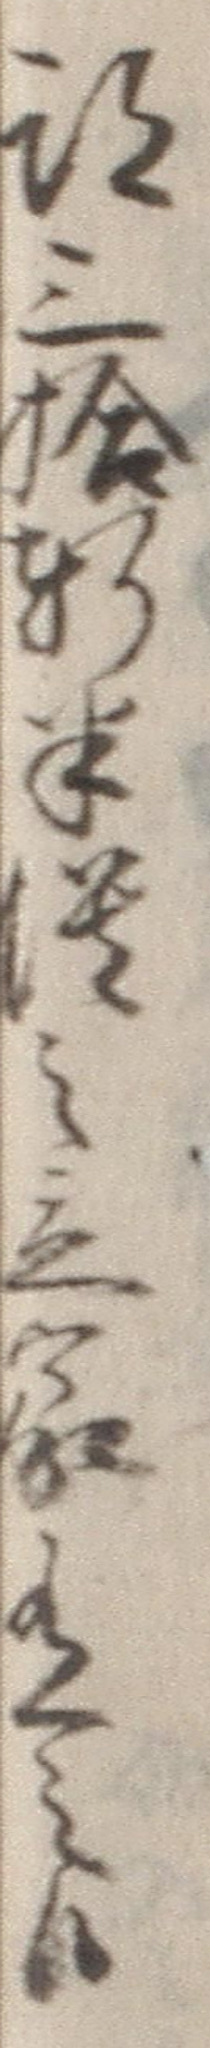跡三拾軒半潰之立家有之候
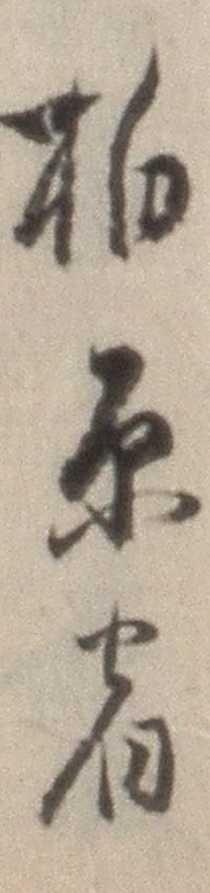柏原宿
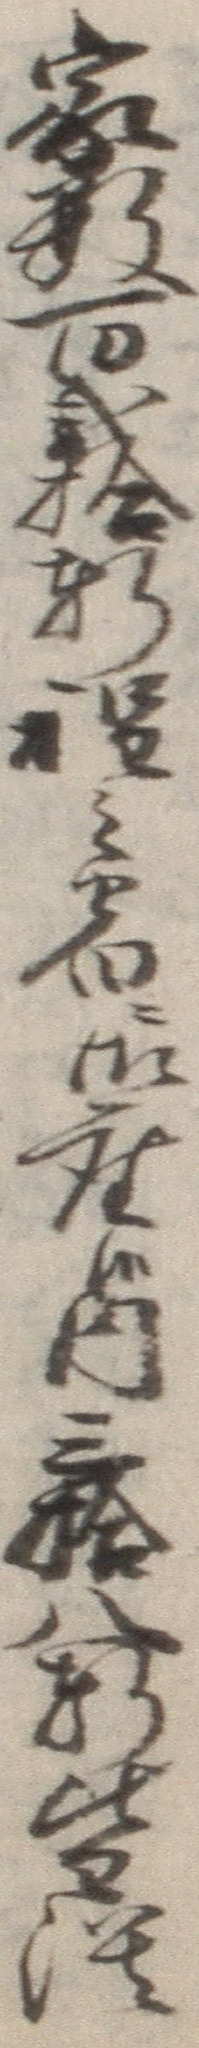家数百弐拾軒程之宿ニ御座候内三拾八軒皆潰
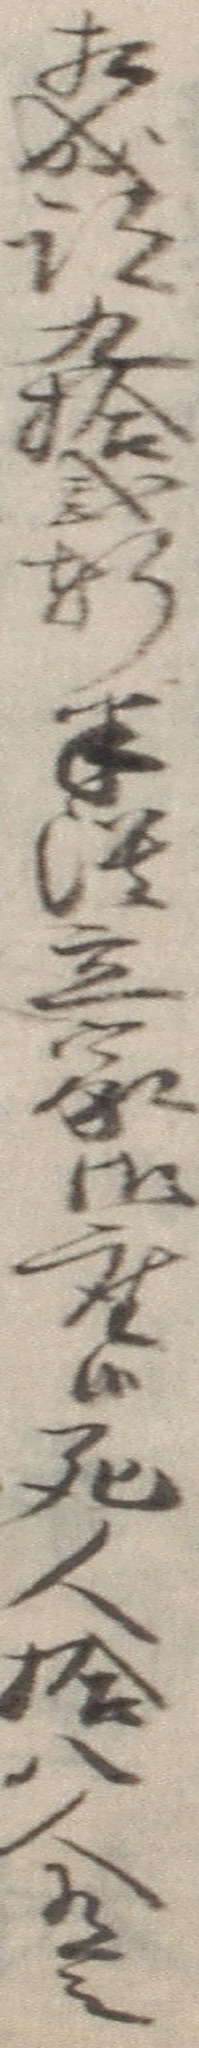相成跡九拾弐軒半潰立家御座候死人拾八人有之
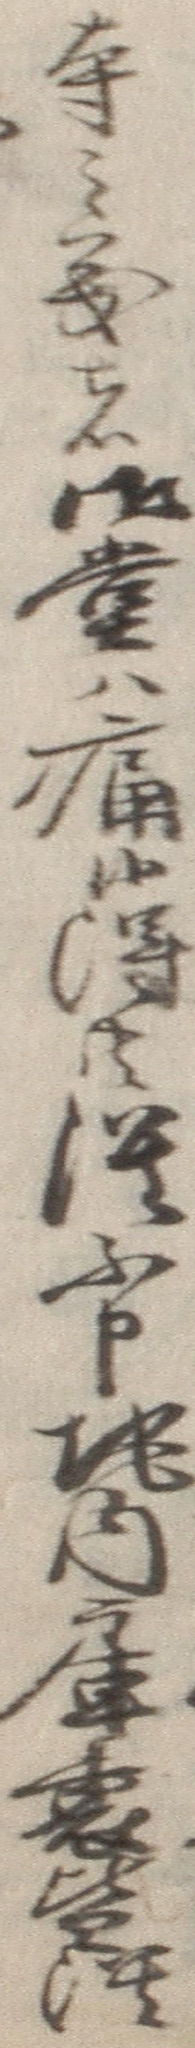寺之義者御堂ハ痛候得共潰不申地内庫裏皆潰
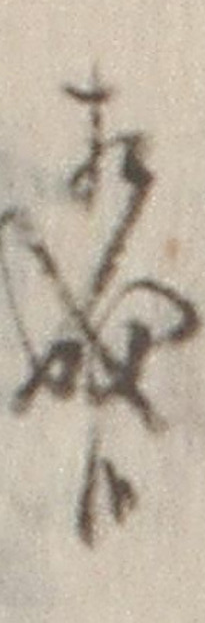相成候
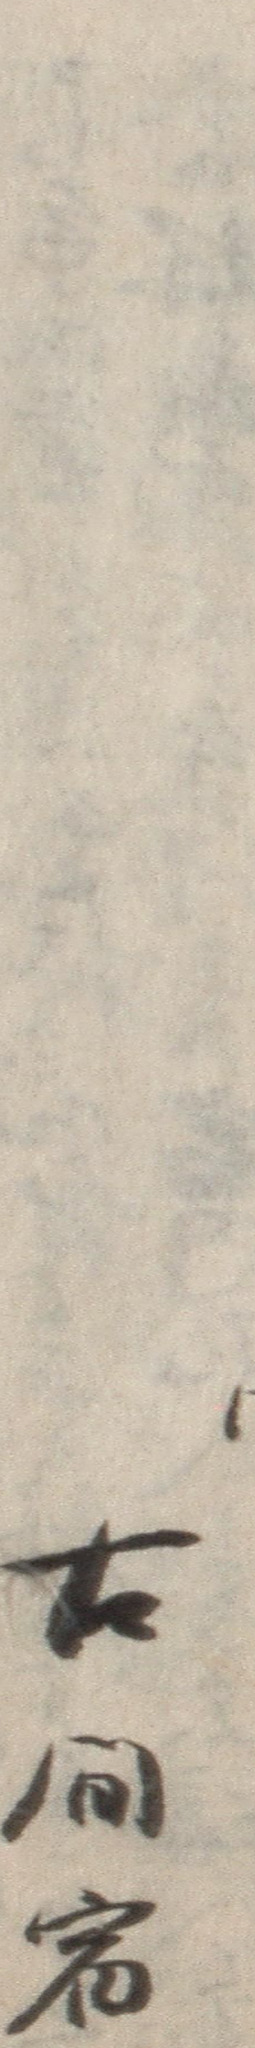古間宿
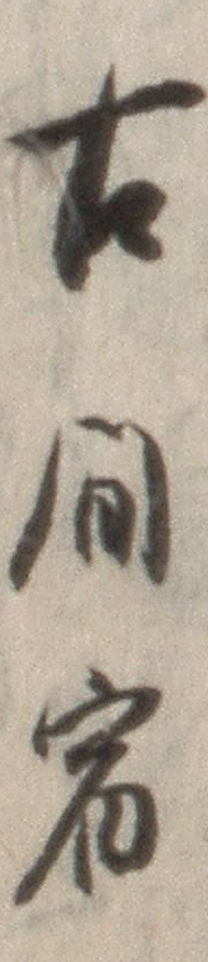古間宿
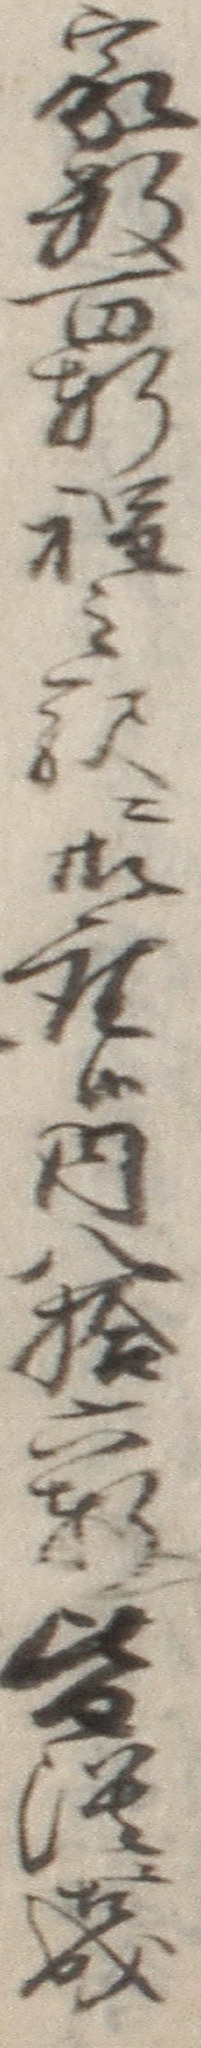家数百軒程之訳二御座候内八拾六軒皆潰ニ相成
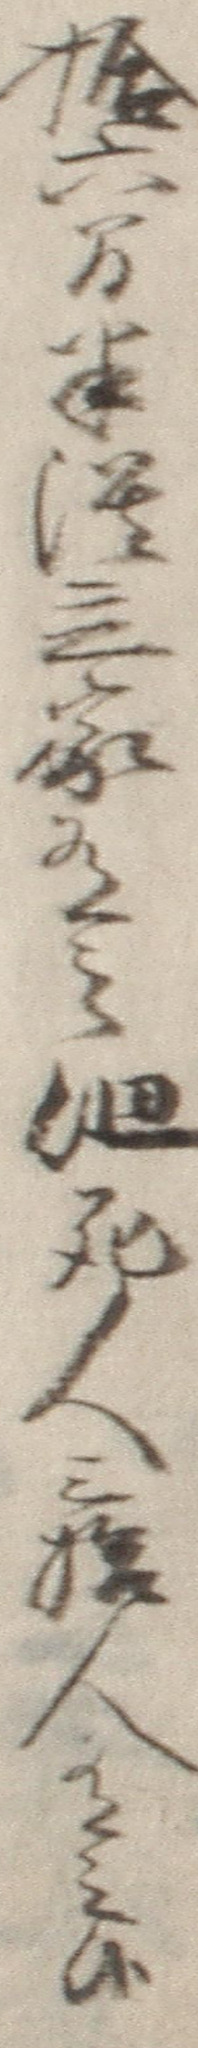拾六間半潰立家有之候但死人三拾人有之候
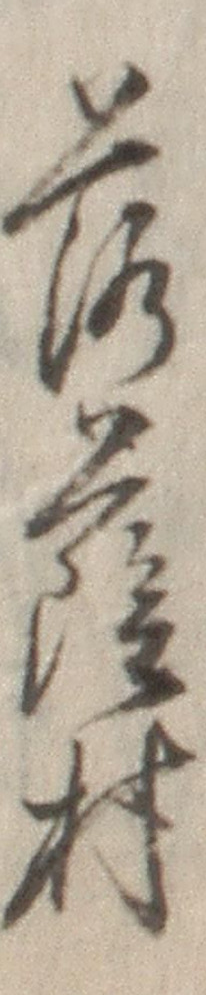落蔭村
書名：[善光寺地震に関する冊子]
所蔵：東京大学地震研究所図書室 Earthquake Research Institute Library, The University of Tokyo, JAPAN
